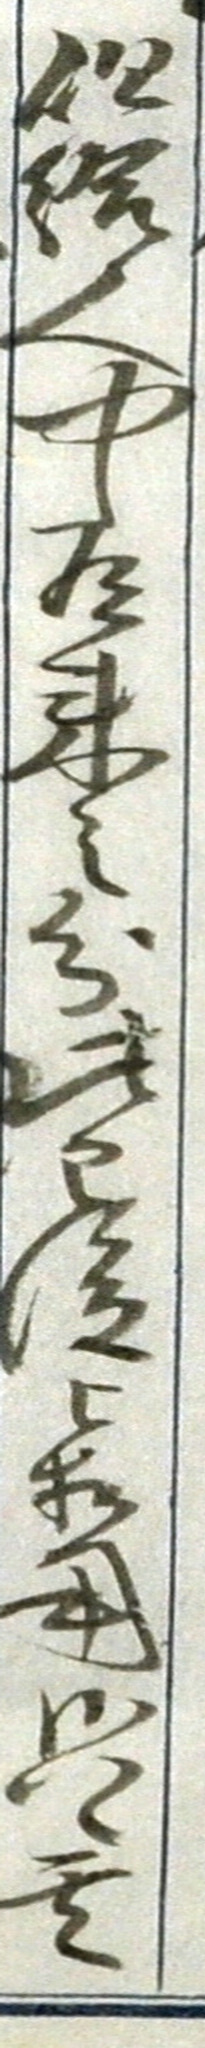但役給人中有来之分此已後被相用候ハヽ其
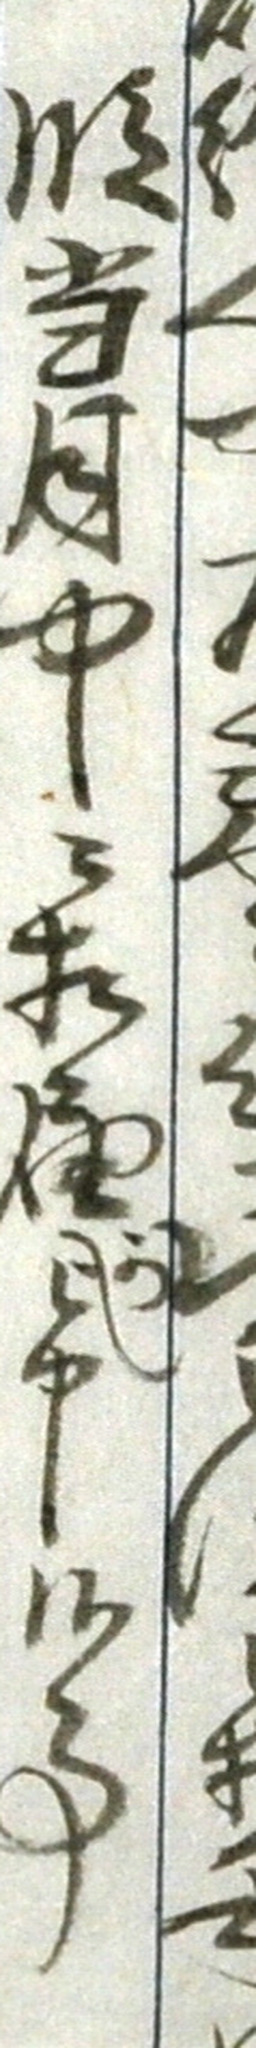段当月中ニ相届可被申候事
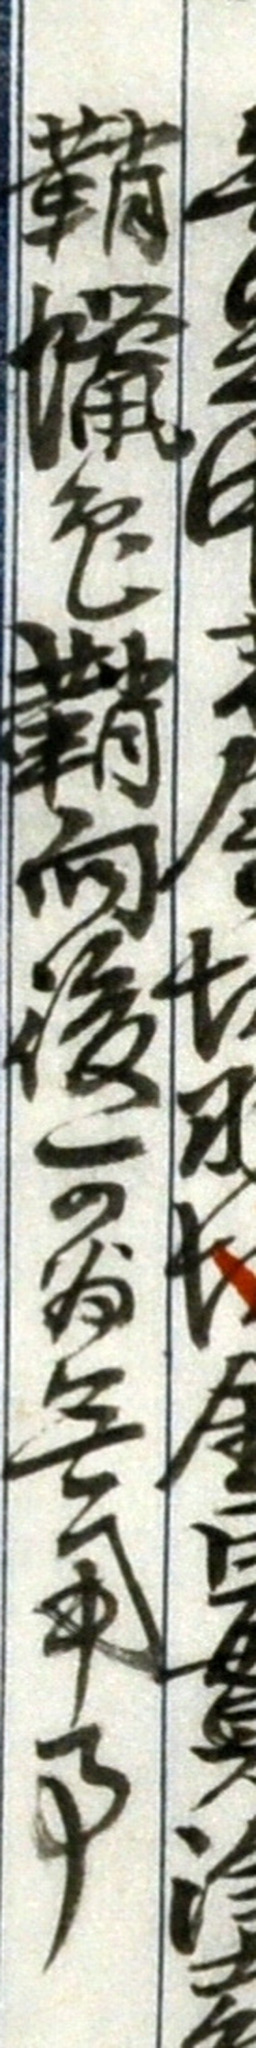鞘蝋色鞘向後可為無用事
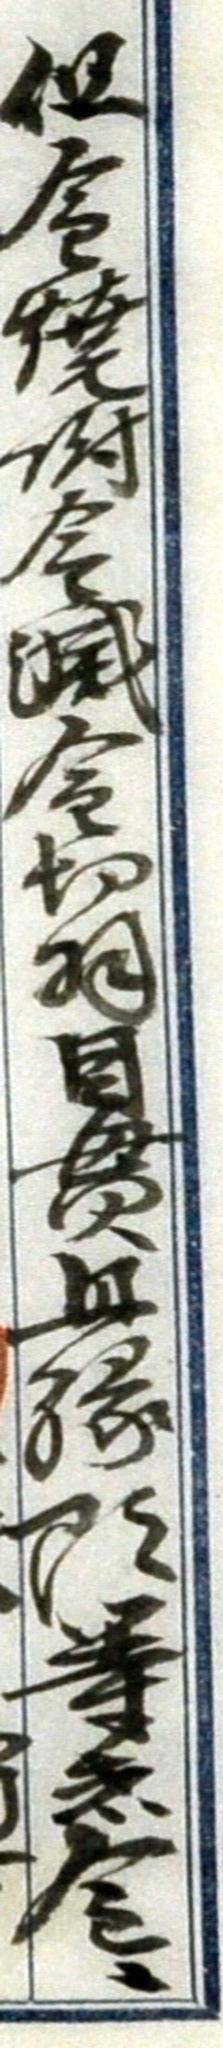但金焼附金滅金切羽目貫且縁頭等は金ニ
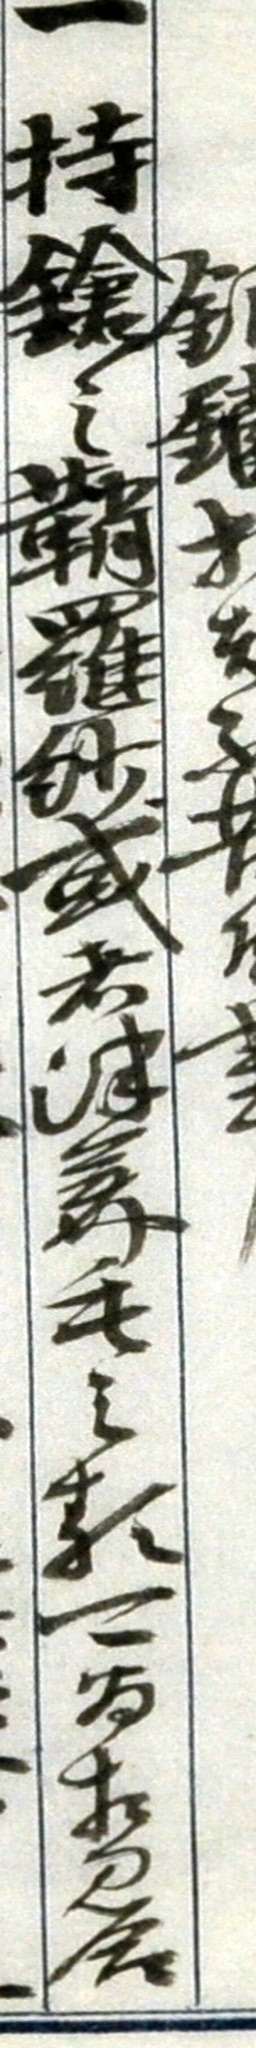一持鎗之鞘羅紗或はつみ毛之類可為相見合
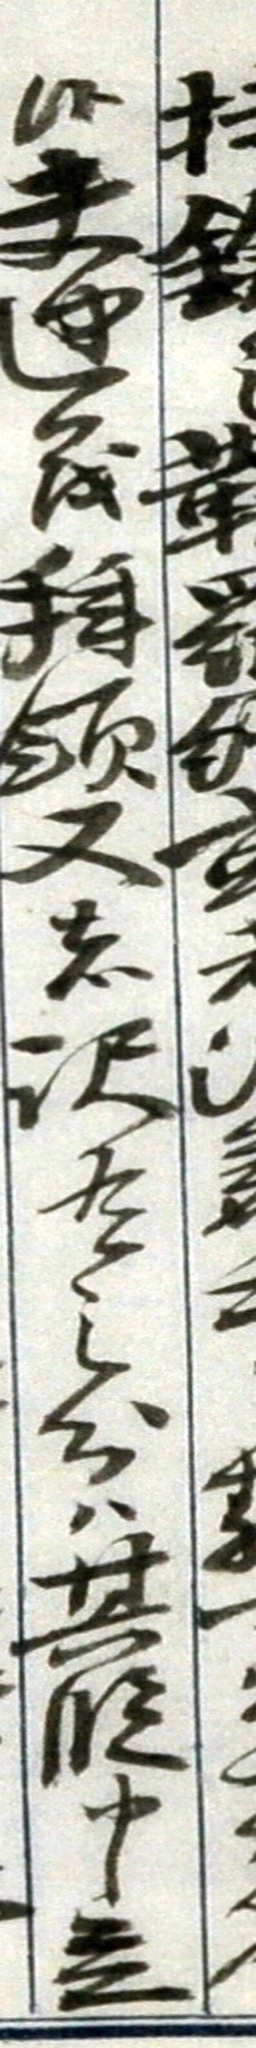候夫迚も拝領又は訳有之分ハ其段申立
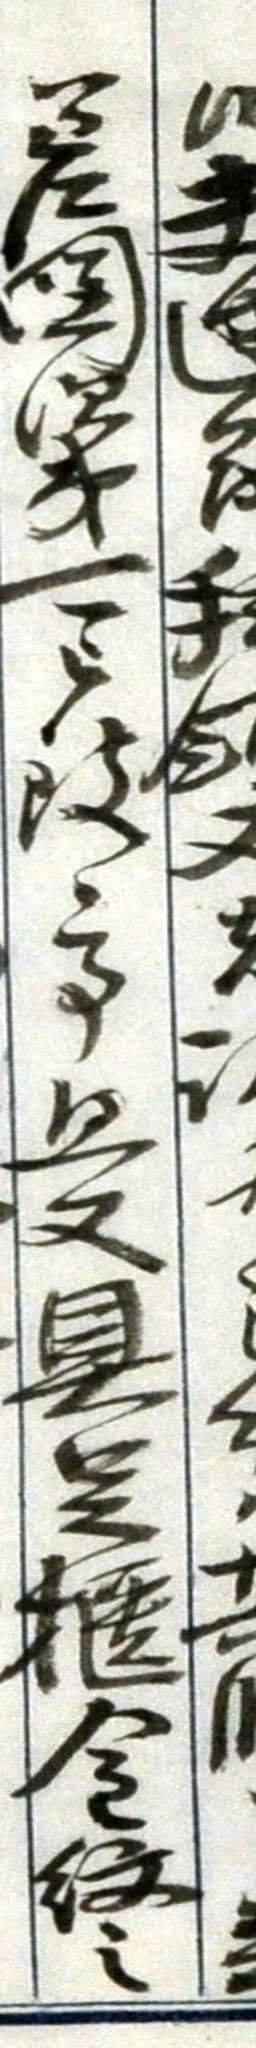差図次第可被致候事且又具足櫃金紋之
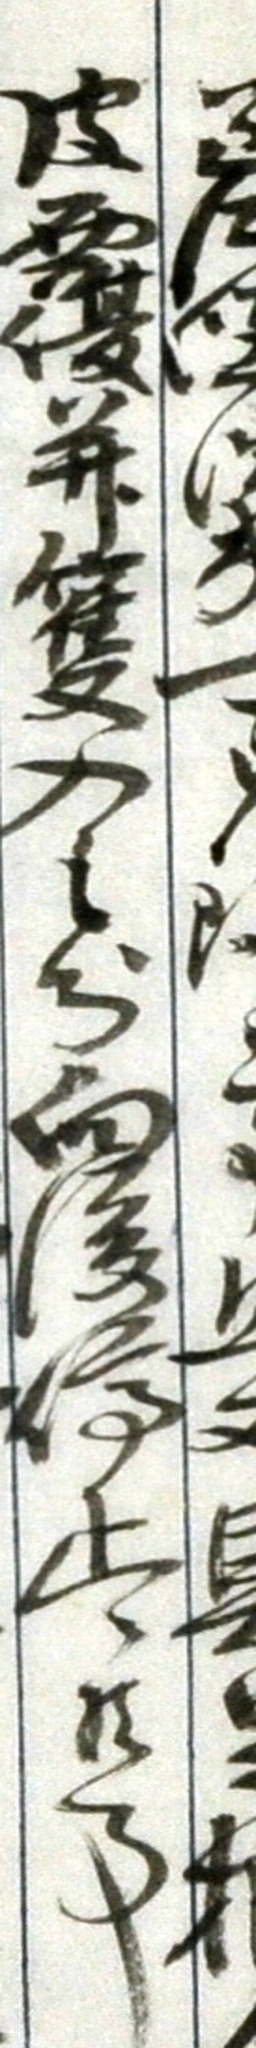皮覆并篗入之分向後停止ニ候事
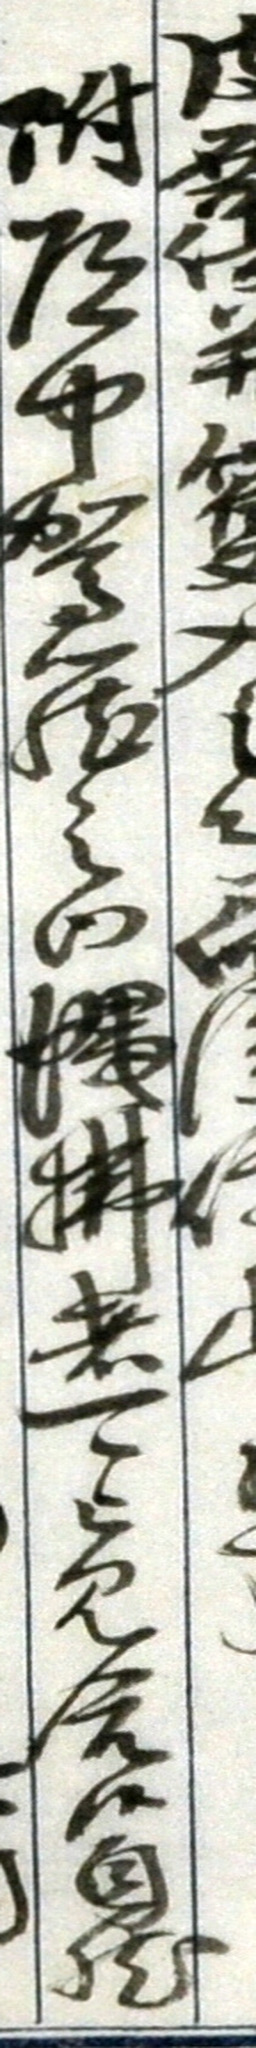附道中駕籠之内蠅払は可被見合候自然
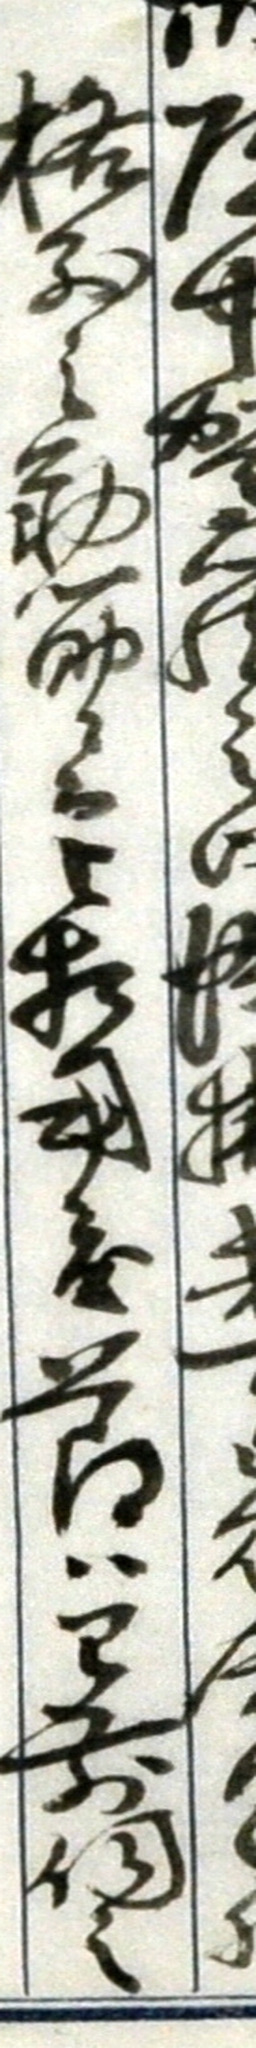格別之勤筋ニ而被相用度節ハ已前伺之
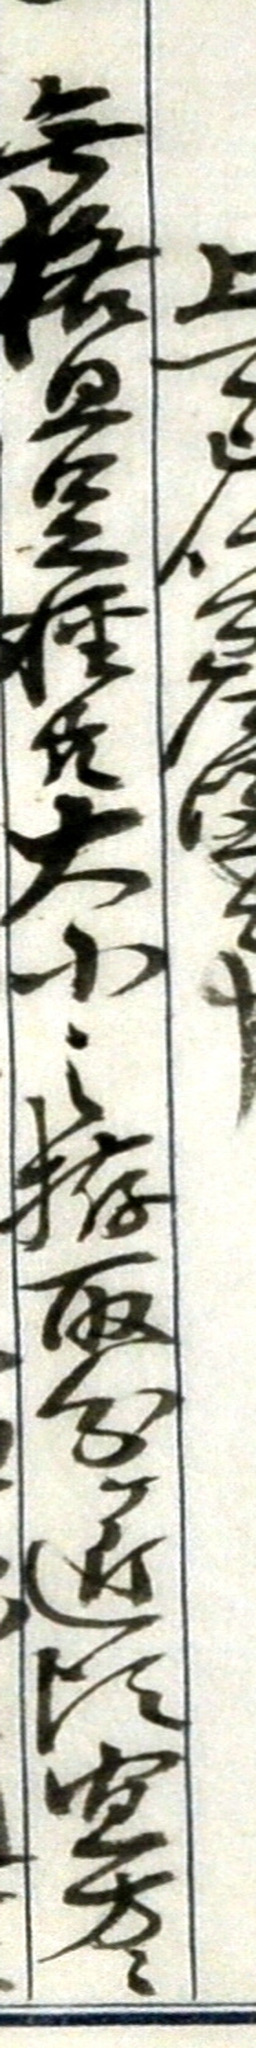一無格且足軽共大小之拵取分ヶ近頃宜方ニ
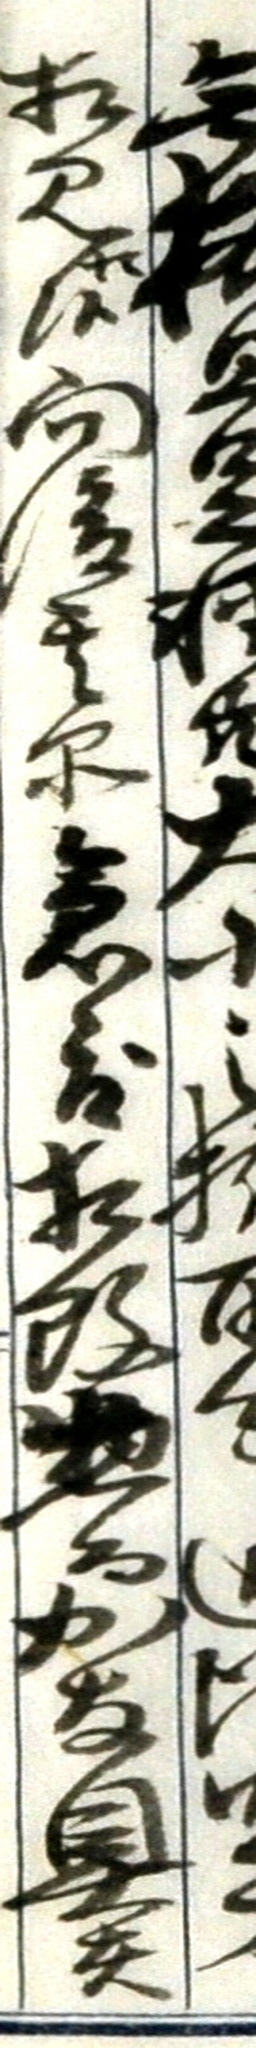相見え候向後其品急度相改惣而かな具は

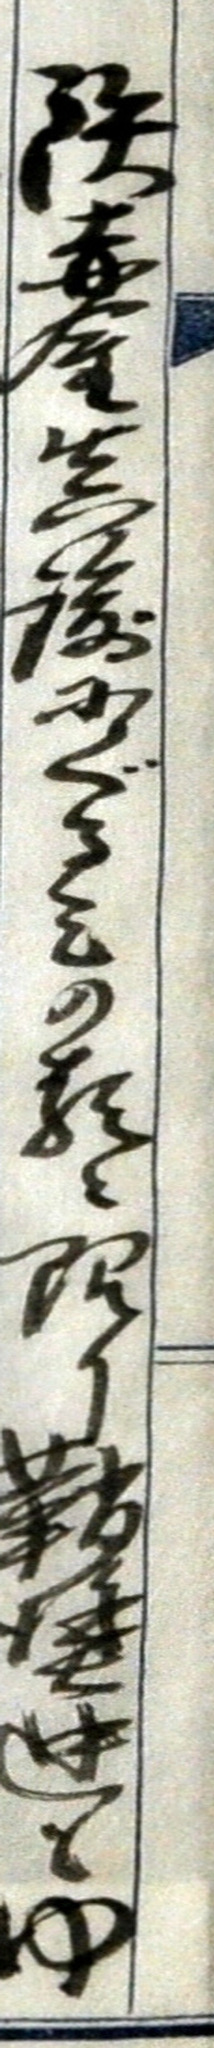鉄赤金真鍮にぐるミの類ニ限り鞘塗迚もゆ
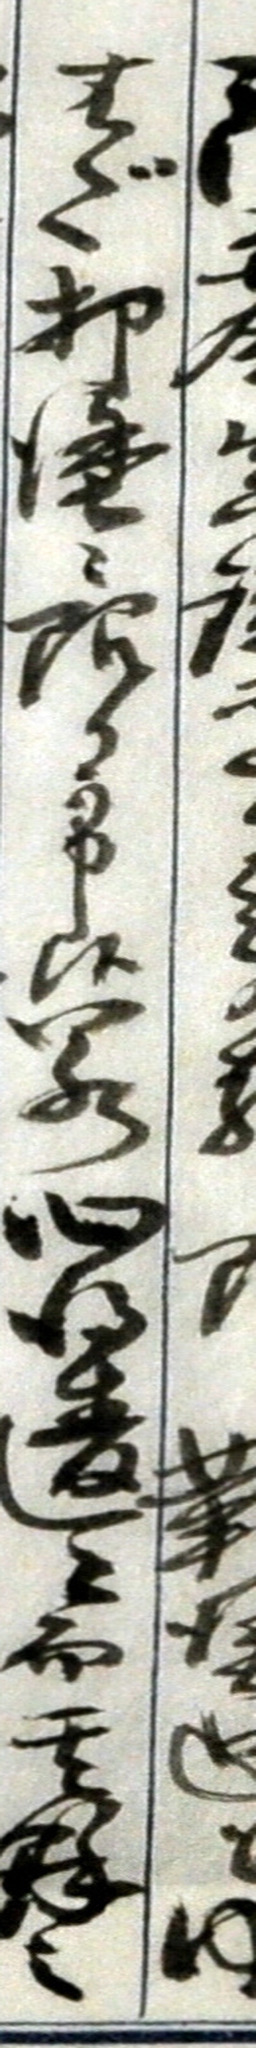はだ打塗ニ限り可申候若心得違ニ而其余之
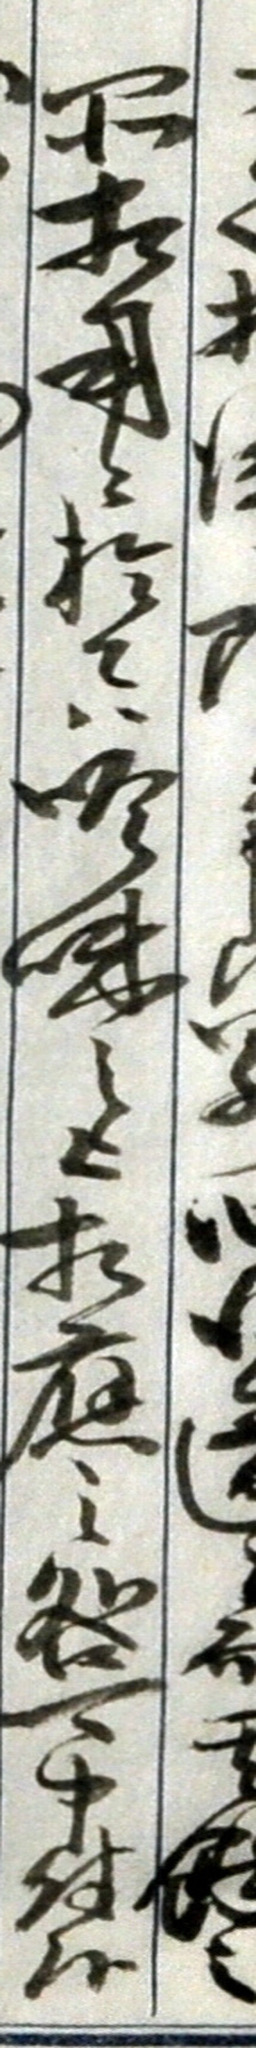品相用ニ於てハ吟味之上相応之咎可申付候
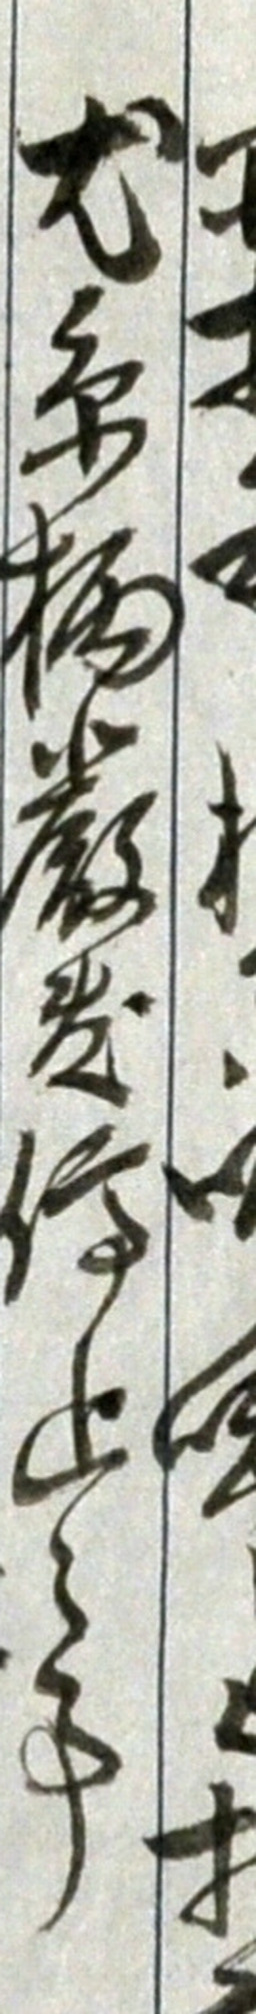尤糸柄厳敷停止之事
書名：御倹約被仰出書
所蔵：伊那市立高遠町図書館・合同会社AMANE
